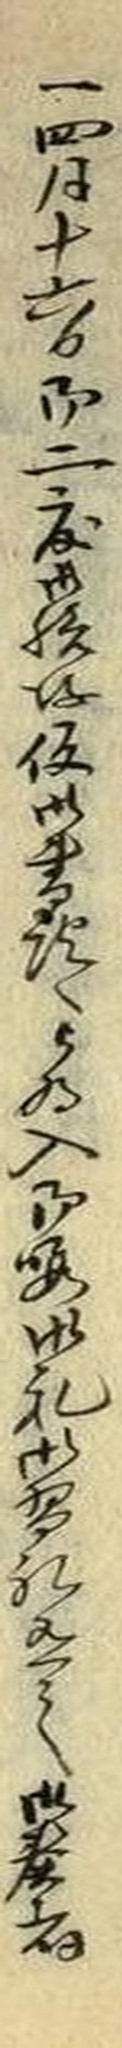一四月十六日御二度御膳後仮御書院へ被為入御暇御礼御習礼有之御奏者
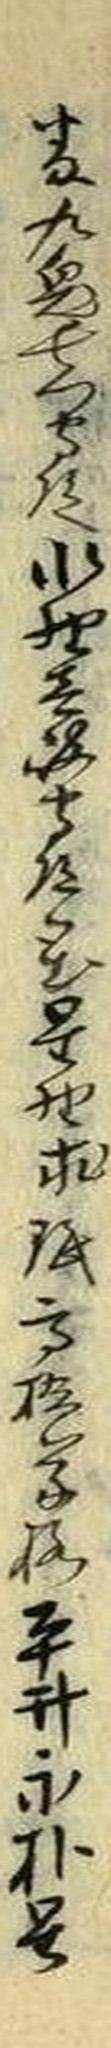番九鬼長門守殿水野壱岐守殿御出星野求珉高橋栄格平井永朴星
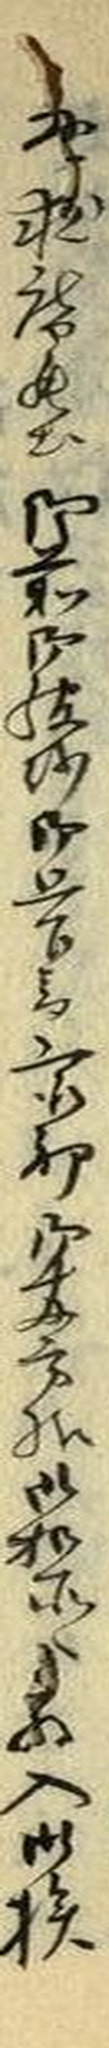野求庵罷出御前御袱紗御上下ニ而最初御両方様御扣所へ被為入御挨
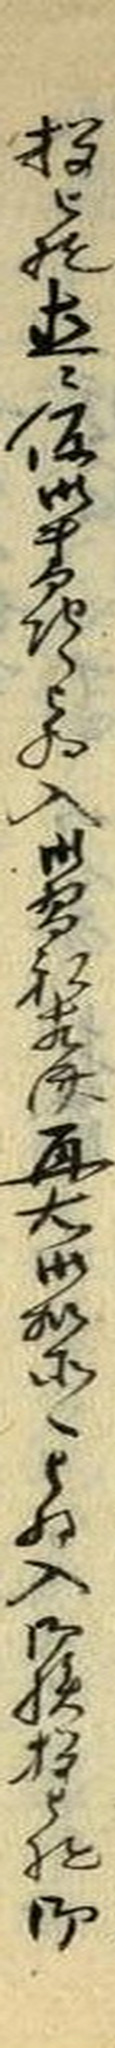拶被遊直ニ仮御書院へ被為入御習礼相済再右御扣所へ被為入御挨拶被遊御
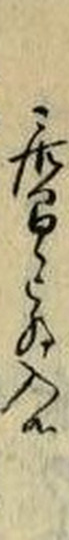居間へ被為入候
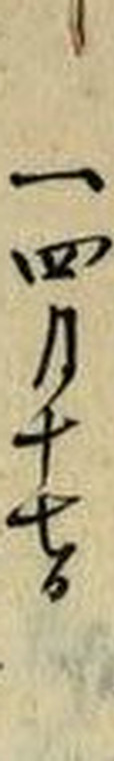一四月十七日
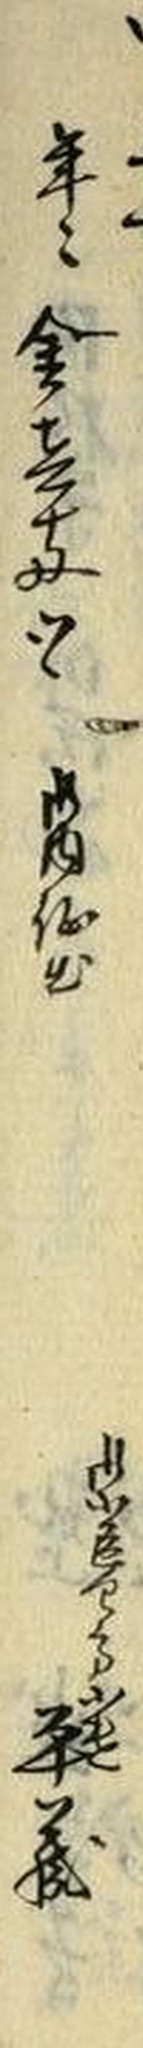年々金壱両ツヽ御内証出御小道具方小遣平蔵
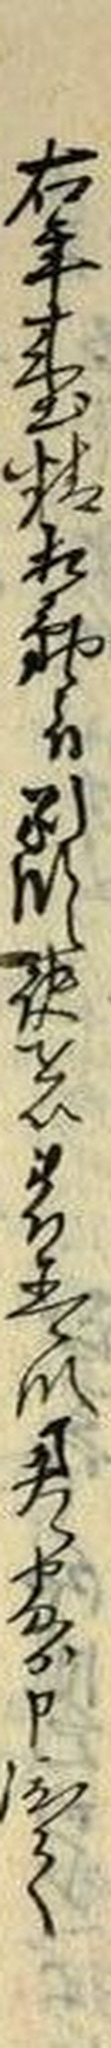右年来出精相勤候ニ付別段之訳を以被下置候段奥之番ゟ申渡之
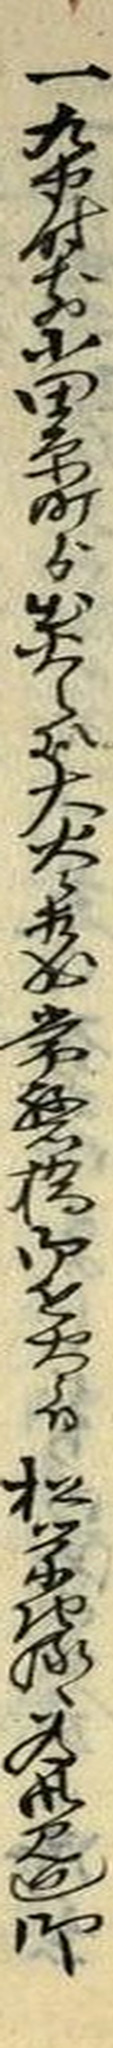一九半時前小田原町ゟ出火候処大火ニ相成常磐橋御近火ニ付松栄院様へ為御見廻御
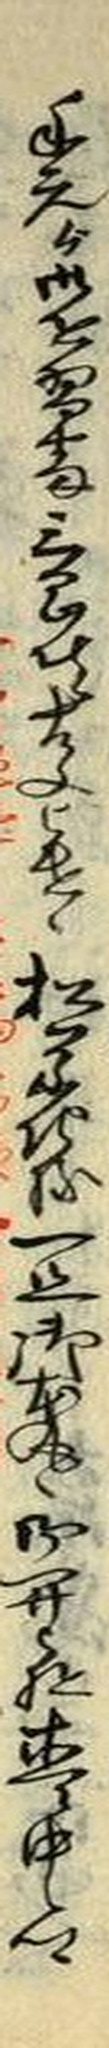手元ゟ御近習番三岡次郎太夫被遣候松栄院様一旦御本丸へ御開被遊直ニ中之郷
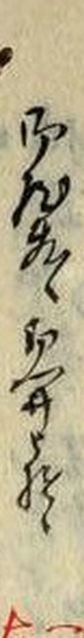御屋敷へ御開被遊候
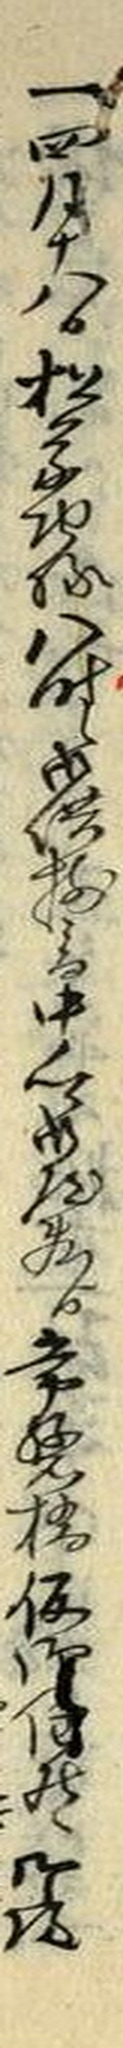一四月十八日松栄院様八時之御供揃ニ而中之郷御屋敷ゟ常磐橋仮御住居へ御帰
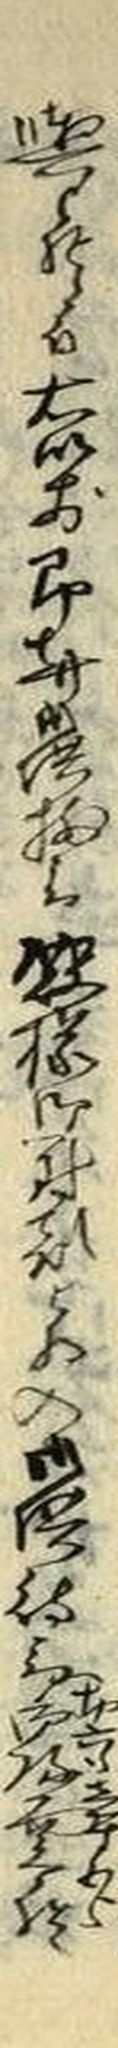輿被遊候ニ付右御前即刻御供揃ニ而殿様御対顔被為入御供待ニ而切六ツ壱寸五分御帰殿被被遊候
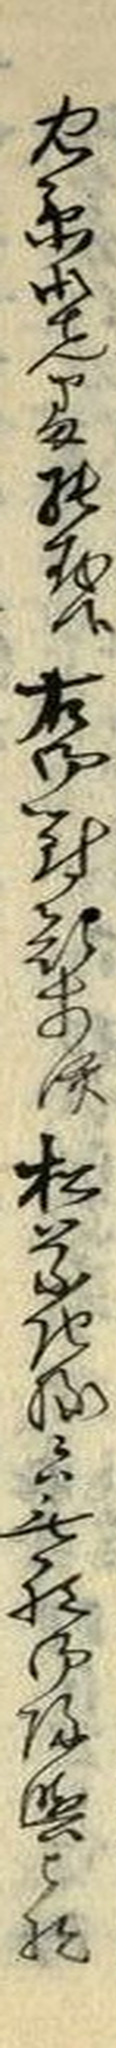忠兵衛御先番罷越候右御対顔相済松栄院様ニハ無程御帰輿被遊
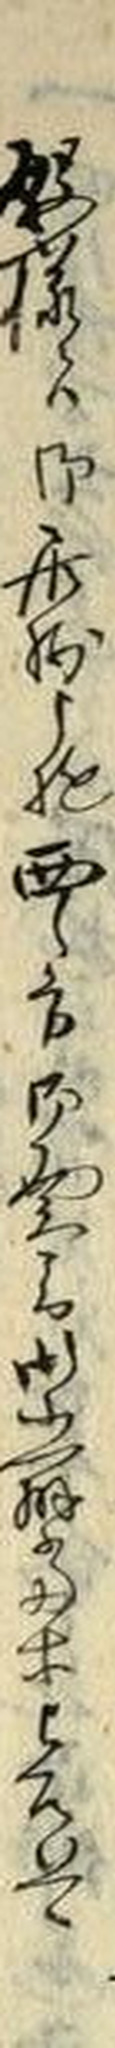殿様ニハ御居残被遊西之方御殿ニ而小弁当等被召上候
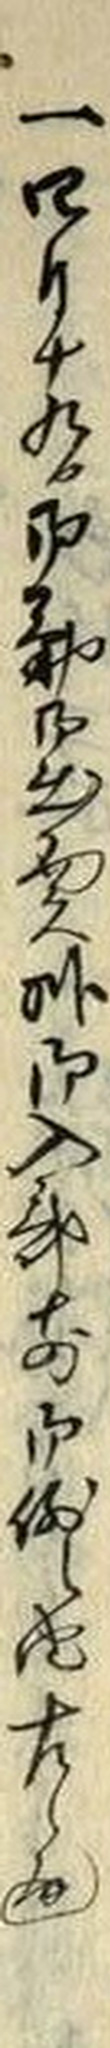一四月十九日御勤御出殿掛御入部前御例之由左之通
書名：少傅日録抄（斉善付側向頭取日記、江戸并道中、初入在国、逝去後…
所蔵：福井県文書館 Fukui Prefectural Archives
